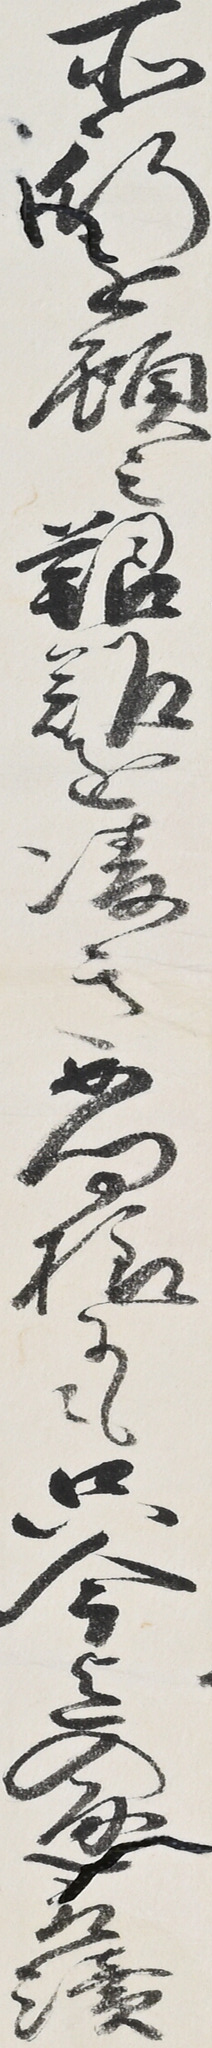所行を顧み艱難を凌き如何様にも只今迄の通取続
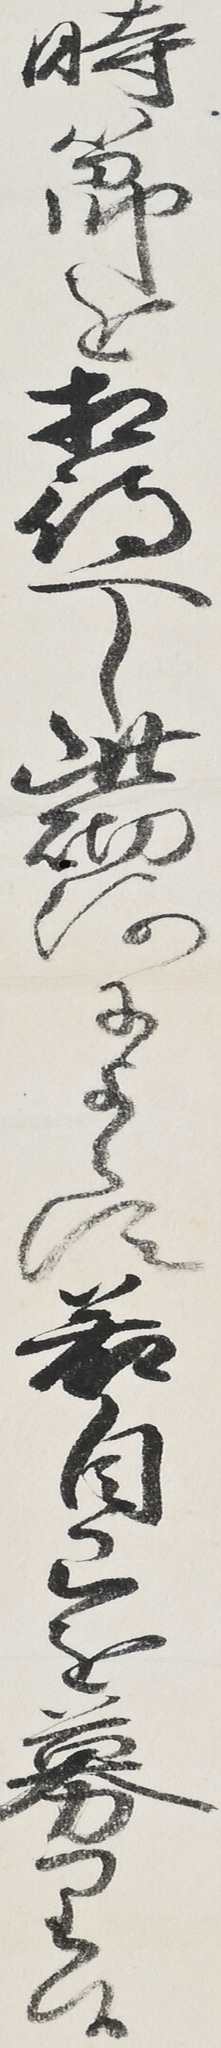時節を相待へし此砌何によらす若自己を募り候
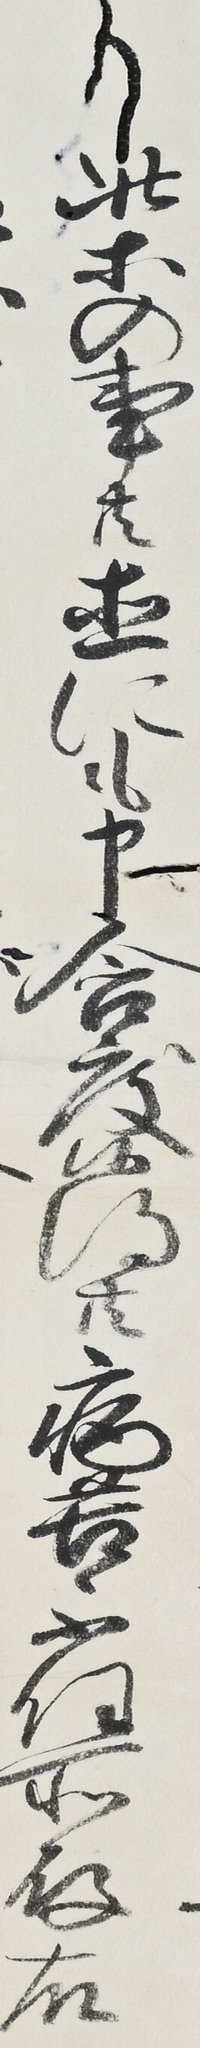此等の事共直にも申含度候得共病苦不任所存故
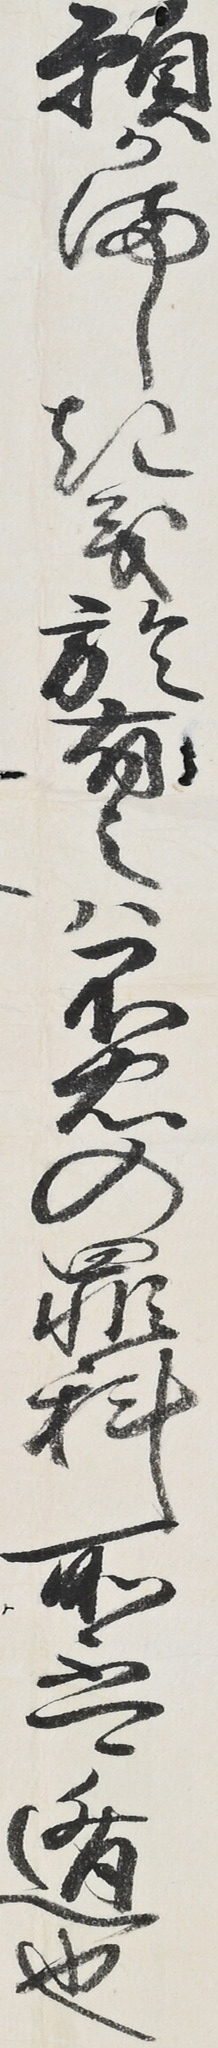願かましき義於有之は不忠の罪科所不可遁也
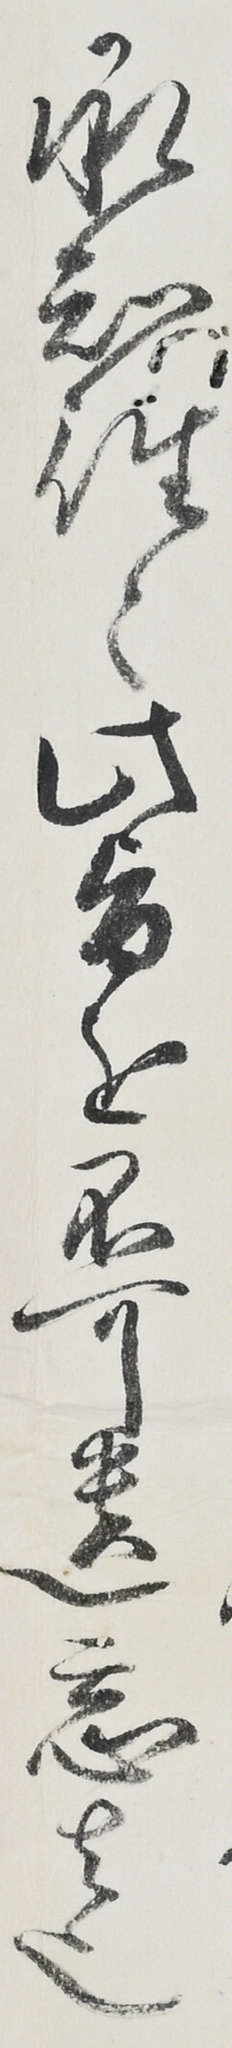承知往々此旨を不可遺忘者也
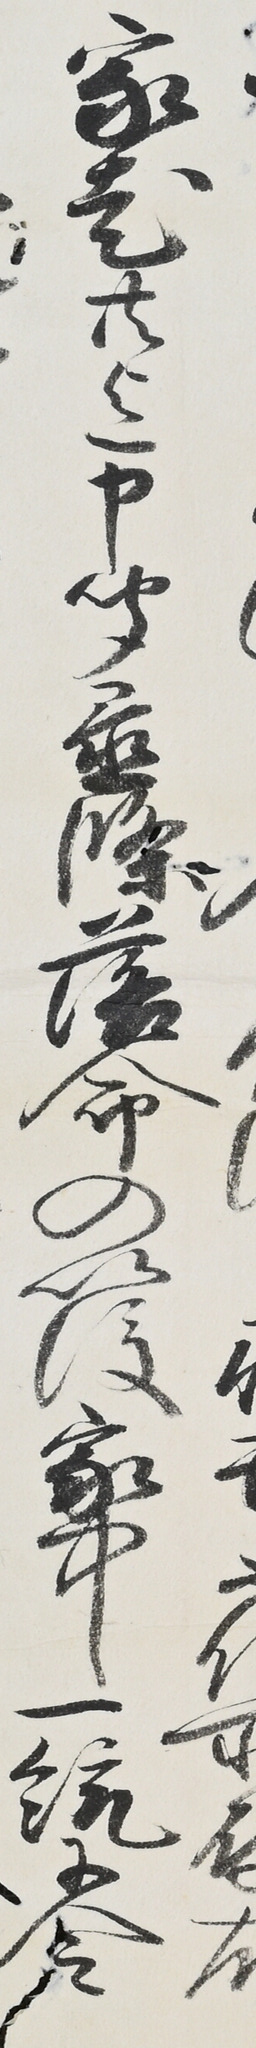家老共迄申聞置條落命の以後家中一統に令
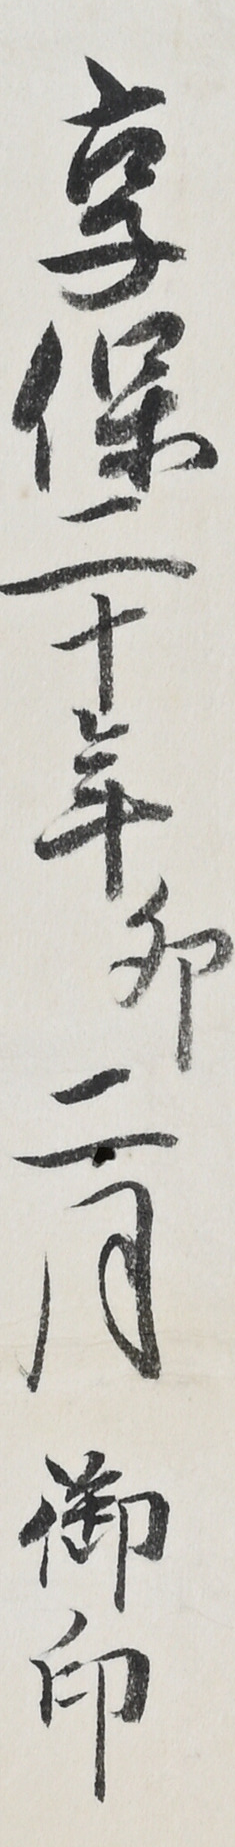享保二十年卯二月御印
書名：御遺言〔写共二通一括〕
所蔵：伊那市立高遠町図書館・合同会社AMANE
